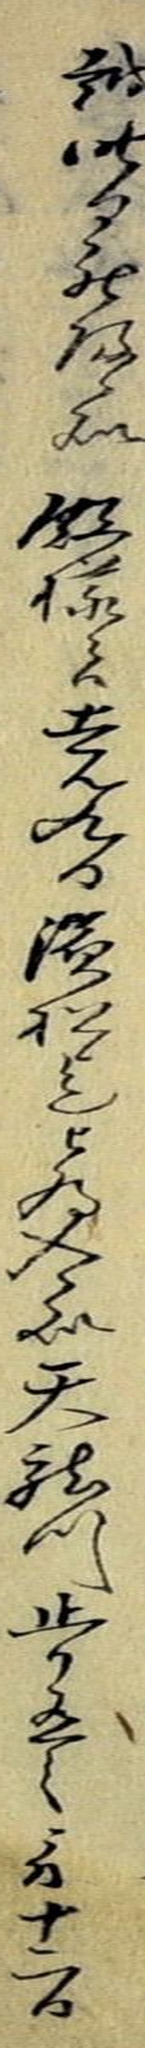越昨日罷帰候処殿様には去ル九日浜松迄被為入候処天竜川止り有之に付十二日
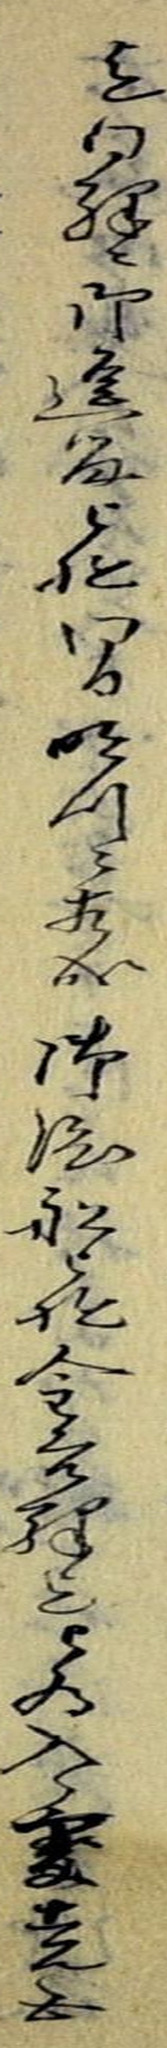迄同駅に御逗留被遊同日明川に相成御渡船被遊金谷駅迄被為入候処去ル五
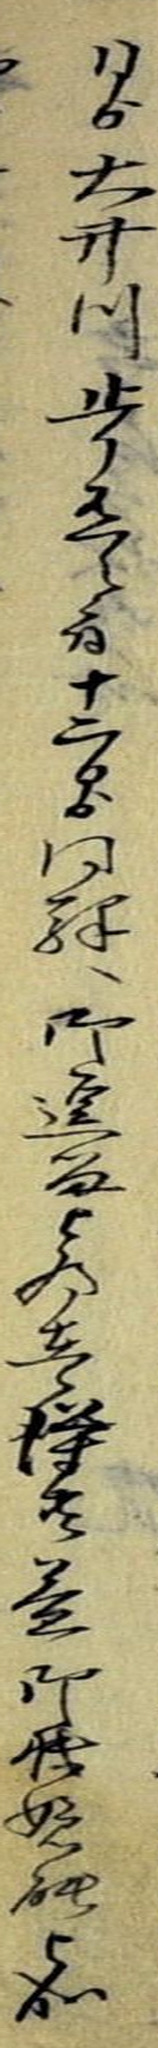月ゟ大井川止り有之に付十二日ゟ同駅へ御逗留被為在候得共益御機嫌能被成
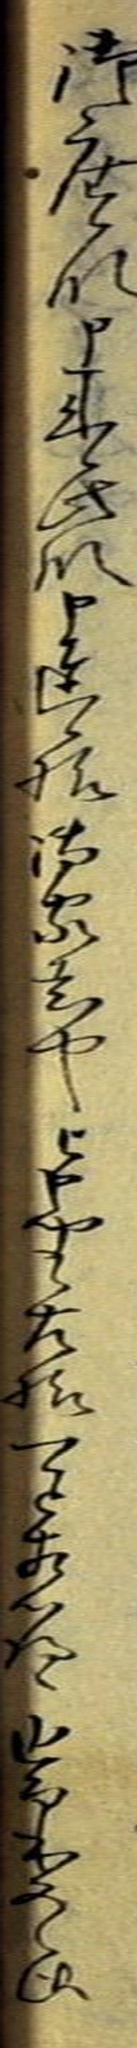御座候段申来候此段申達候様御家老中被申候左様可被相心得候追而右之趣
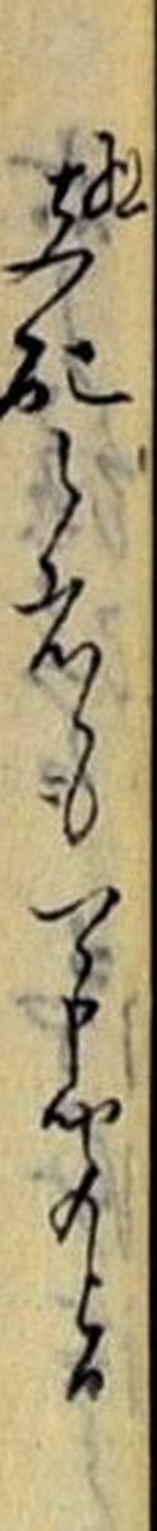組支配之者へも可申聞旨
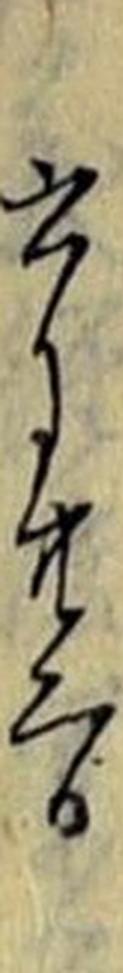六月廿二日
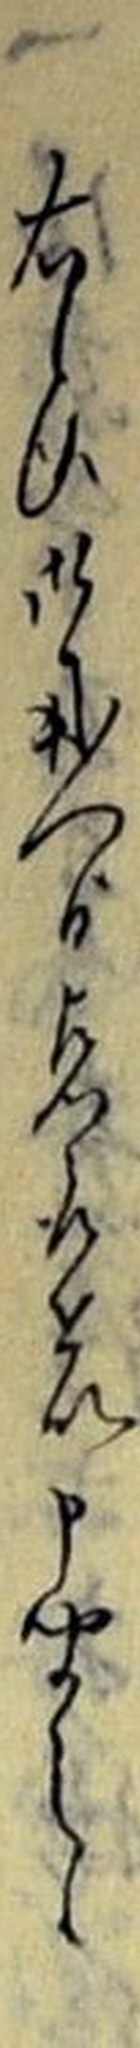右之趣御用人ゟ点取を以申聞之
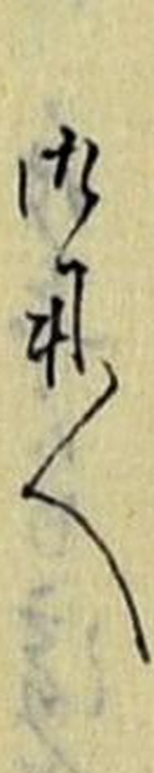御用人
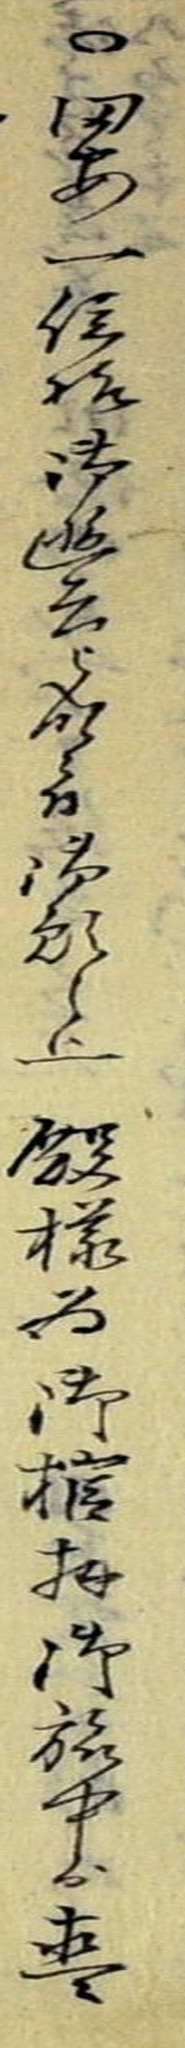○田安一位様御逝去被成候に付御願之上殿様為御棺拝御旅中ゟ直可
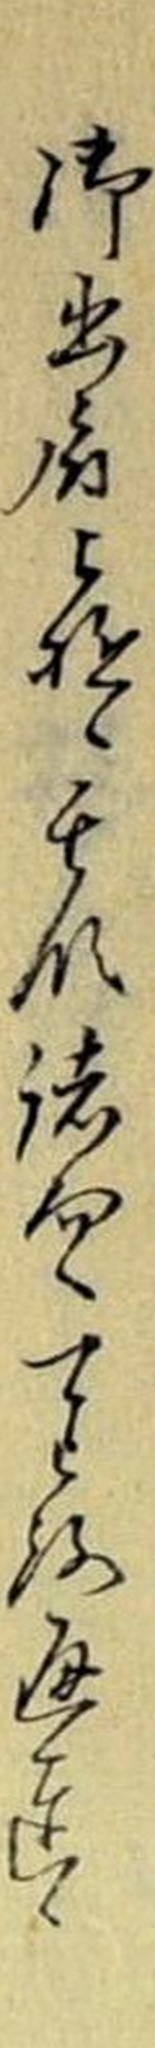御出府被遊候其段諸向へ可被致通達候
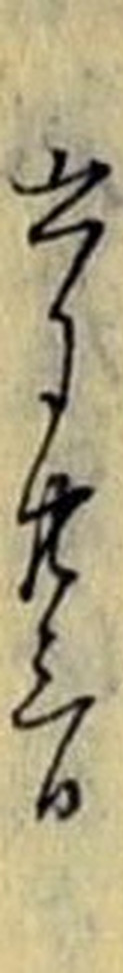六月廿三日
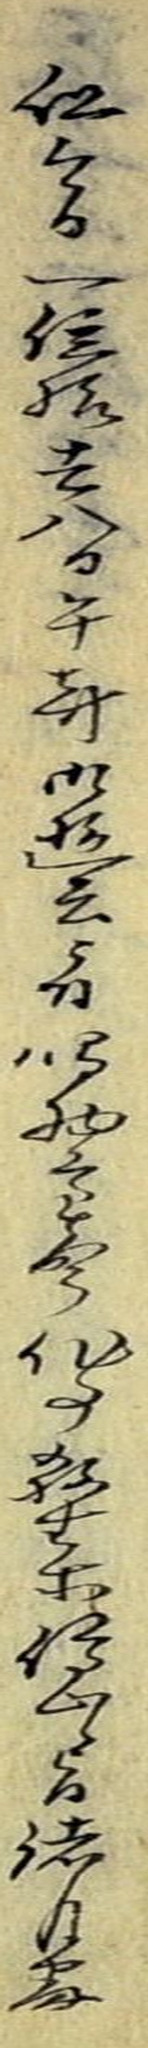但今日一位様去八日午刻御逝去に付鳴物高声作事殺生等停止候旨諸月番
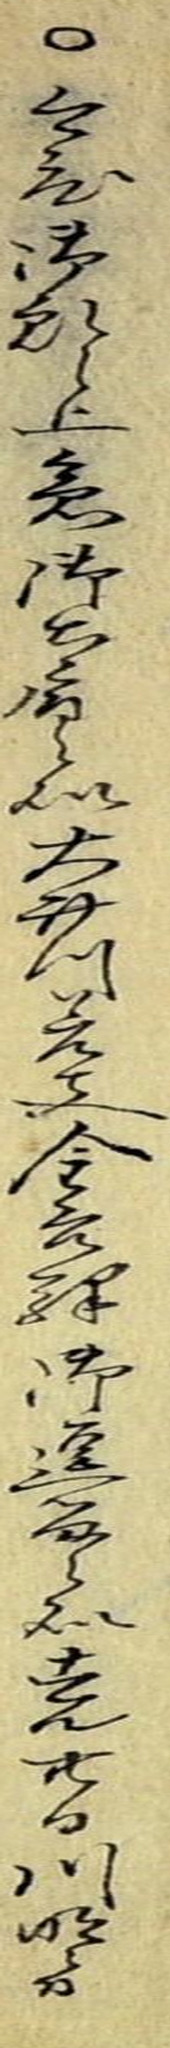○今度御願之上急御出府之処大井川差支金谷駅御逗留之処去ル廿日川明に付
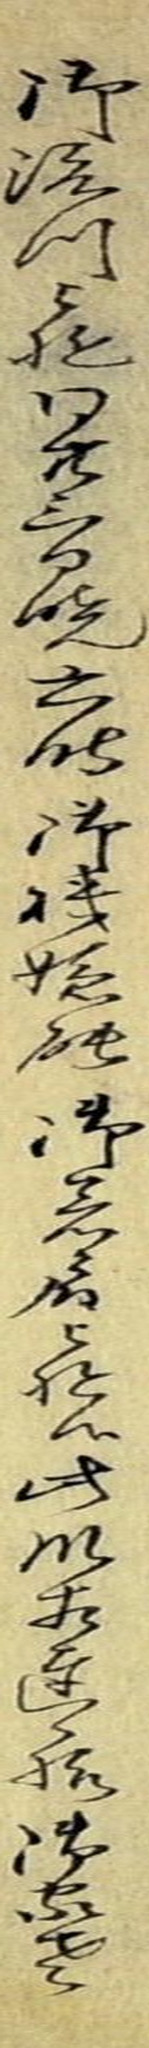御渡川被遊同廿三日晩ん六時御機嫌能御着府被遊候此段相達候様御家老
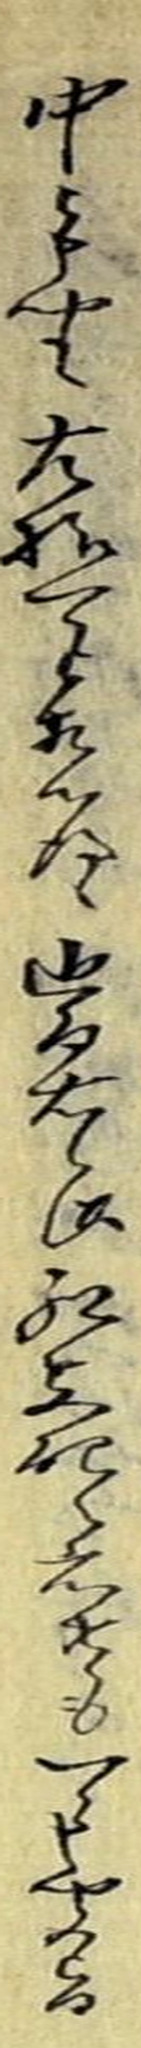中被申聞候左様可被相心得候追而右之趣組支配之者共へも可申聞候
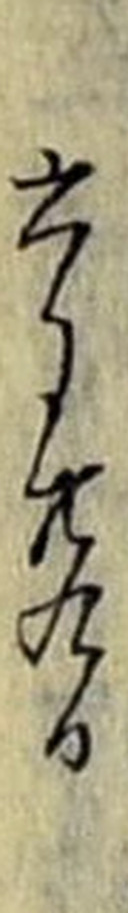六月廿九日
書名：命令之部 六
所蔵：福井県文書館 Fukui Prefectural Archives
